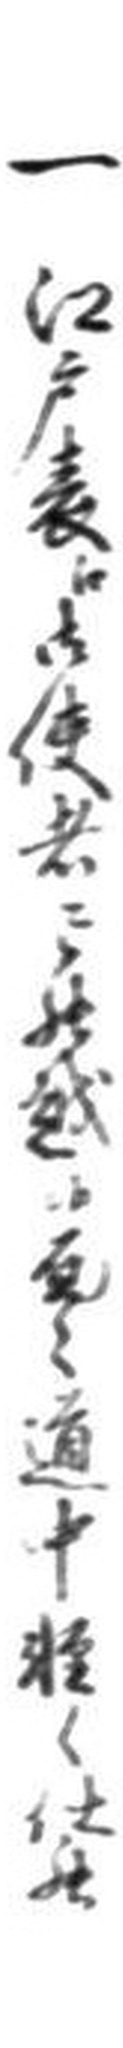一江戸表江御使者ニ罷越候面々道中軽く仕罷
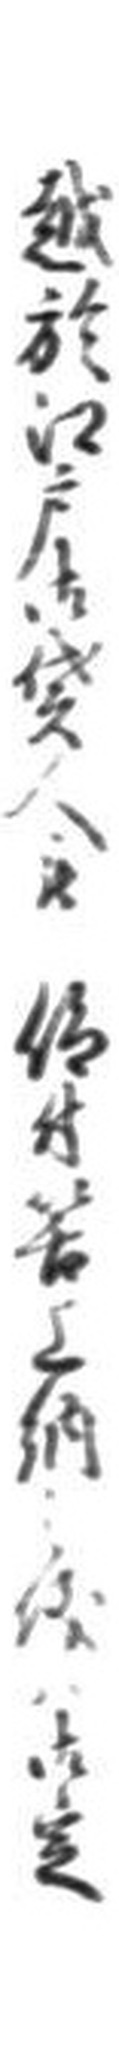越於江戸御貸人被仰付筈上納之儀ハ御定
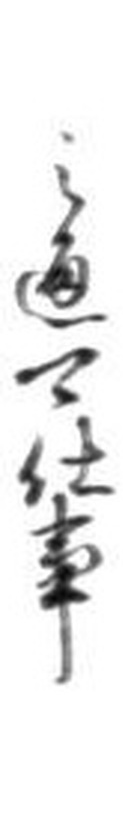之通可仕事
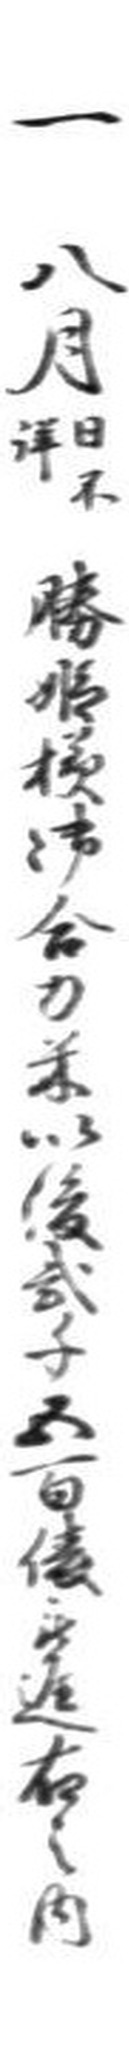詳勝姫様御合力米以後弐千五百俵被進右之内
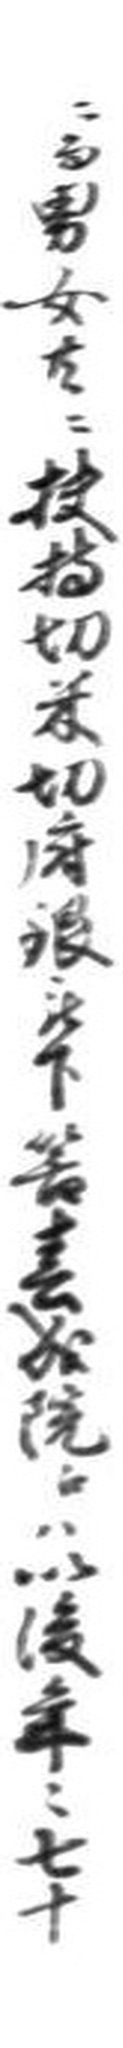ニ而男女共ニ扶持切米切符銀被下筈春成院江ハ以後年々七十
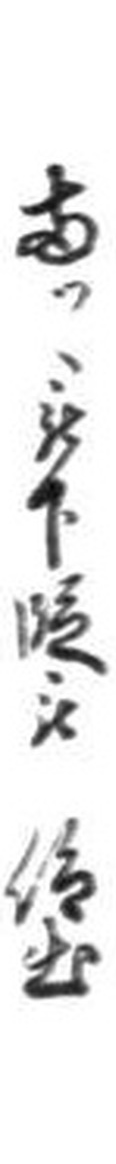両ツヽ被下段被仰出

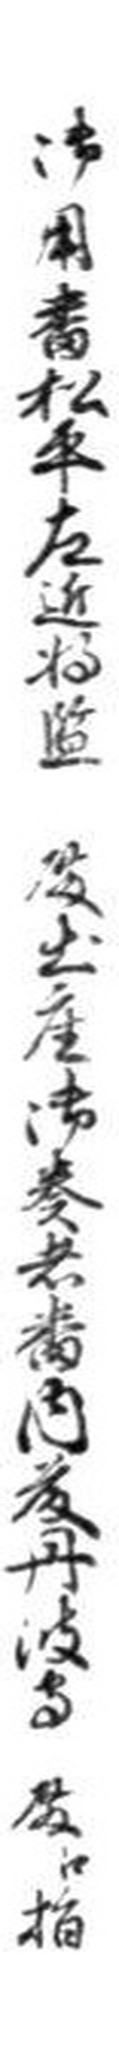御用番松平左近将監殿出座御奏者番内藤丹後守殿江指
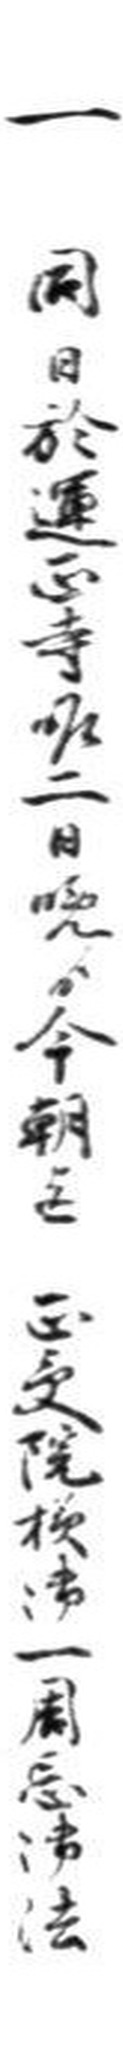一同日於運正寺昨二日晩ゟ今朝迄正受院様御一周忌御法
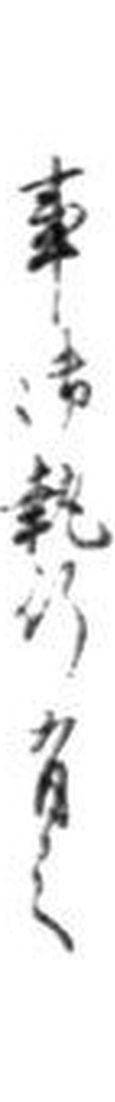事御執行有之
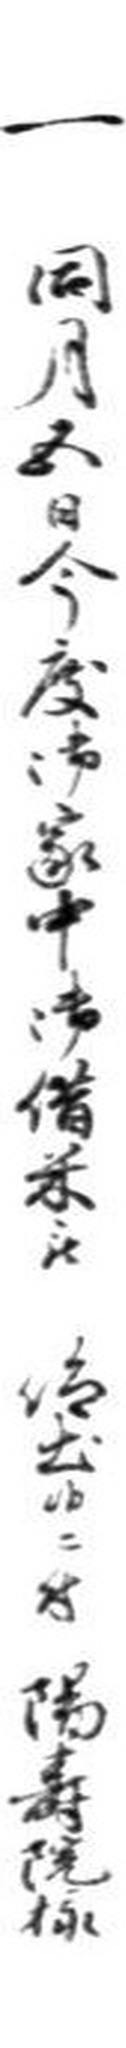一同月五日今度御家中御借米被仰出候ニ付陽寿院様
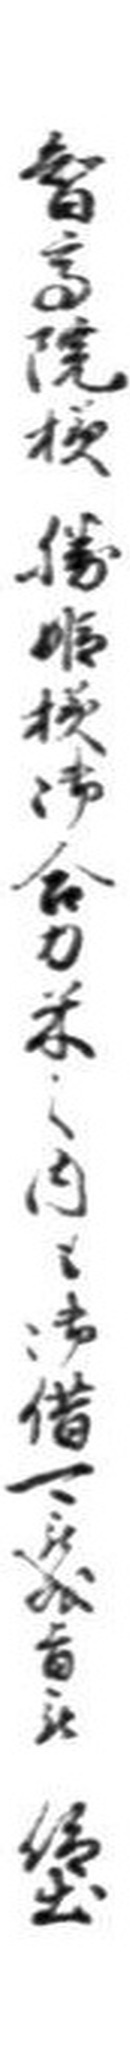智高院様勝姫様御合力米之内も御借可被成旨被仰出
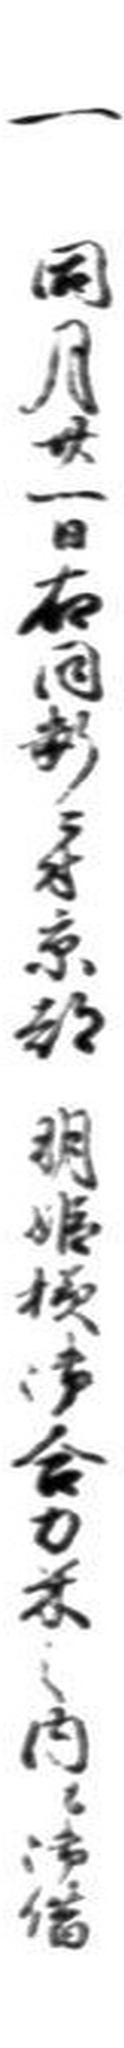一同月廿一日右同断ニ付京都明姫様御合力米之内も御借
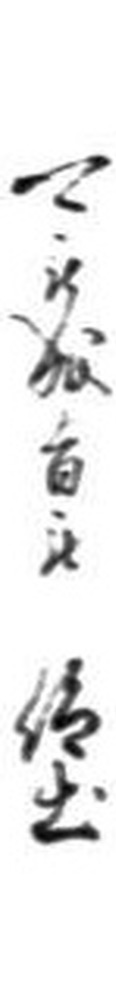可被成旨被仰出
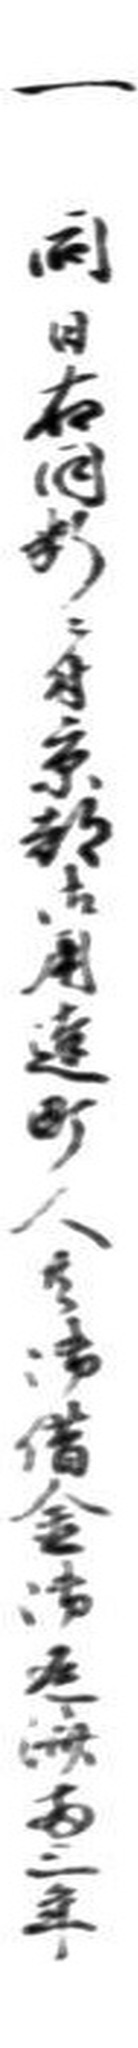一同日右同断ニ付京都御用達町人共御借金御返済両三年
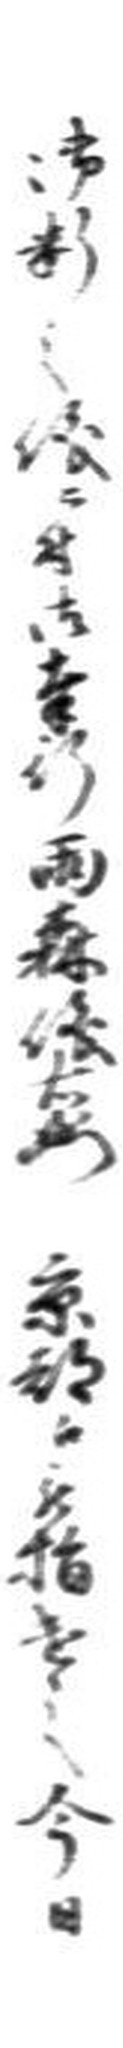御断之儀ニ付御奉行雨森儀右衛門京都江被指遣之今日
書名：家譜 三十八 宗矩公 従享保九年五月到享保九年十二月
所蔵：福井県文書館 Fukui Prefectural Archives
